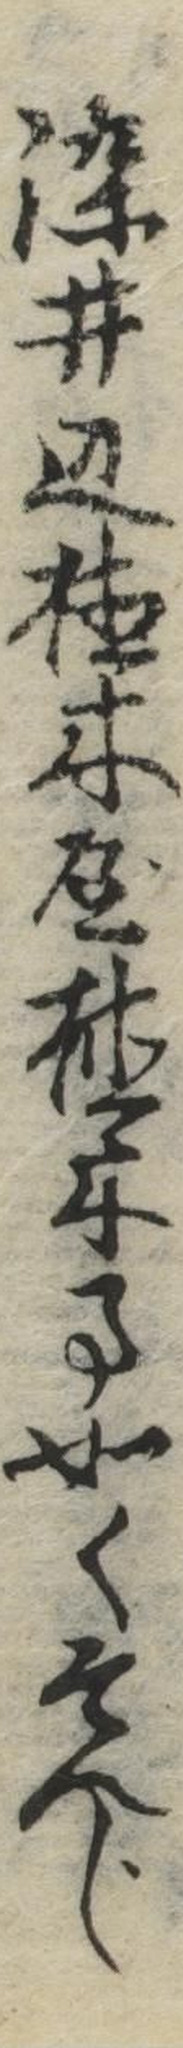染井邊植木屋植木事如くそんじ
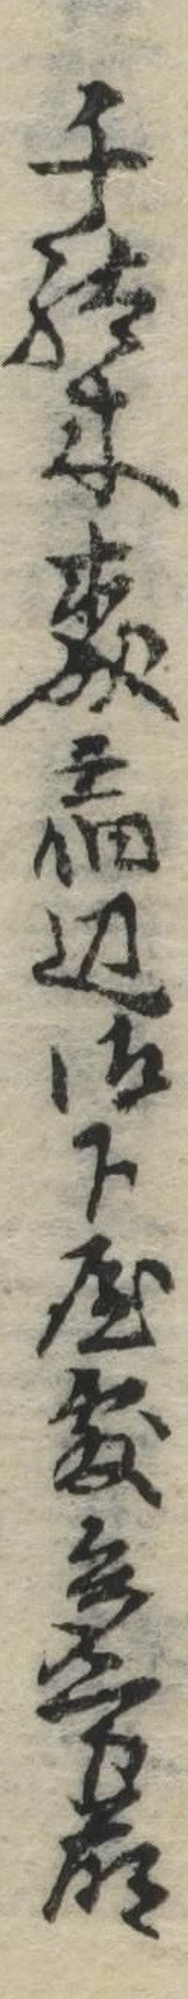千駄木森宿辺御下屋敷多方崩
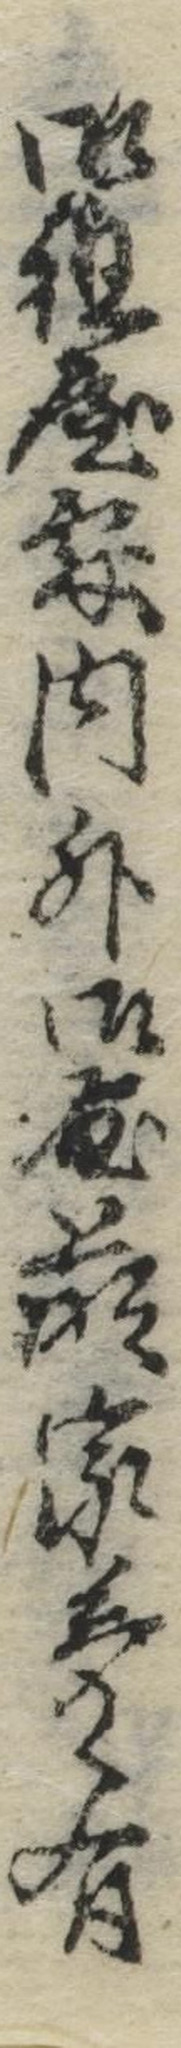御組屋敷内外御取？崩家多く有
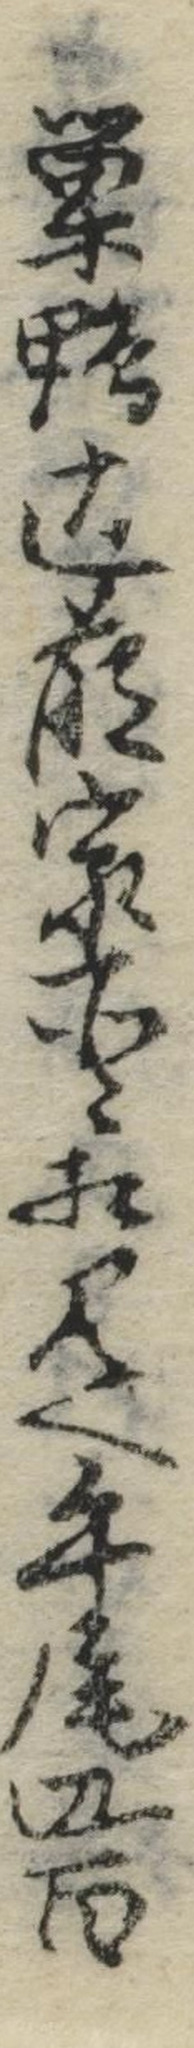巣鴨迄崩家所〻相見へ午尾辺百
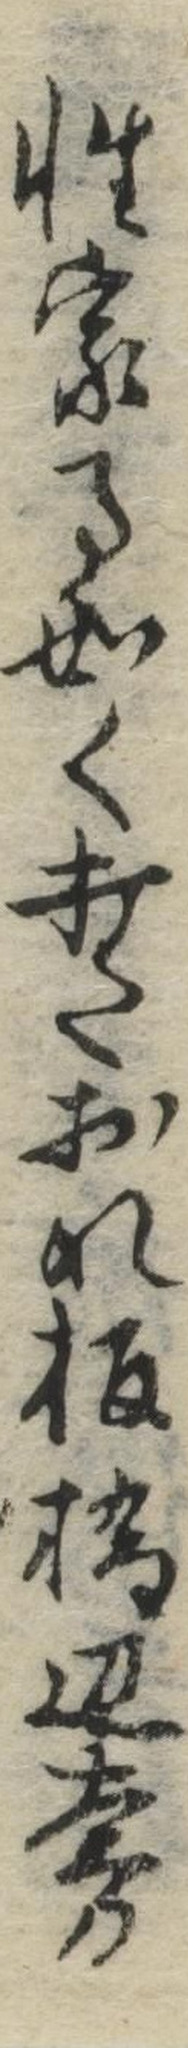性家事如く打たおれ板橋辺大方
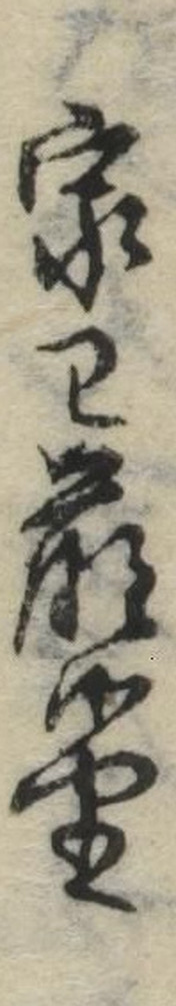家わ崩候由
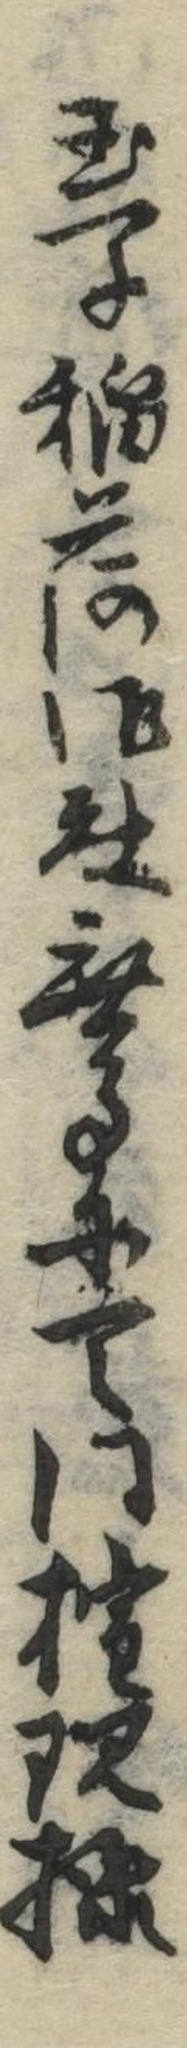王子稲荷御社無事にて同権現様
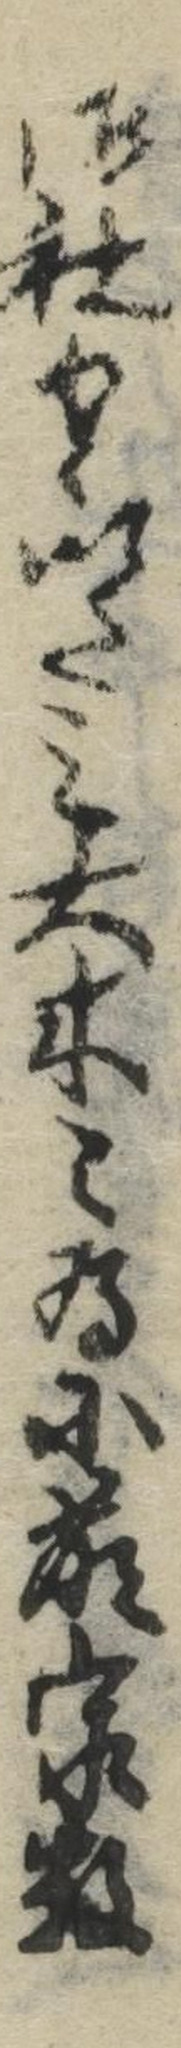御社少〻いたミ大木之為に崩家数
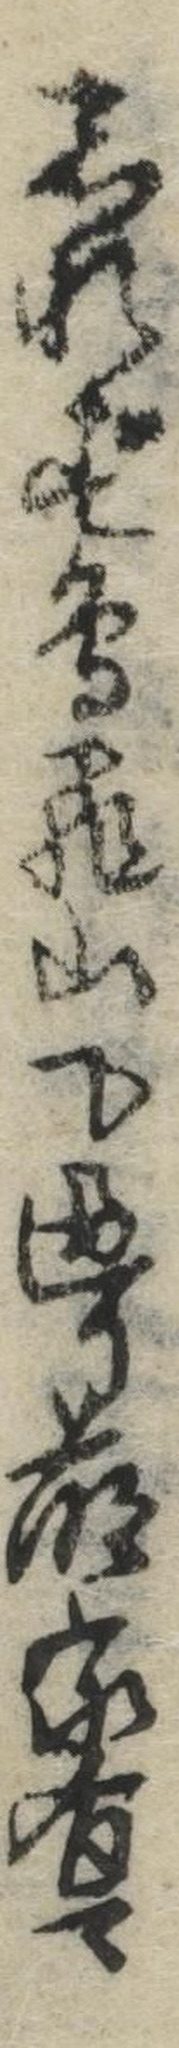しれす鳥飛山下通り崩家有て
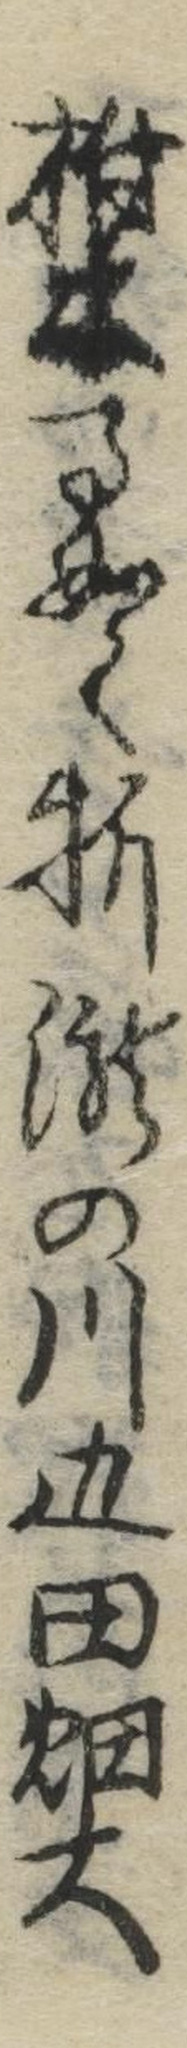椎木事如く折瀧の川辺田畑大
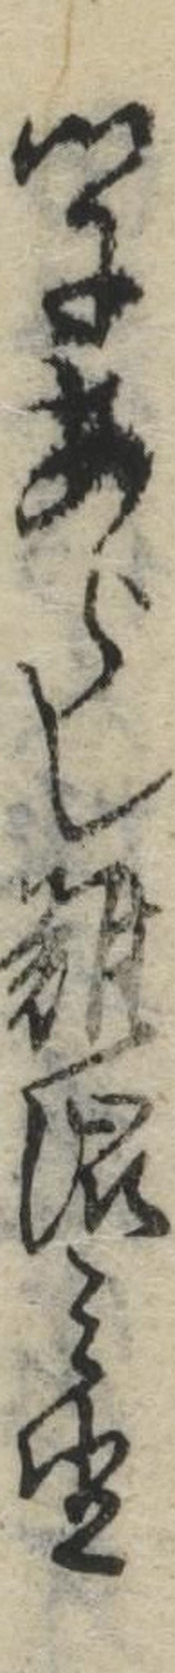いにあらし難渋之由
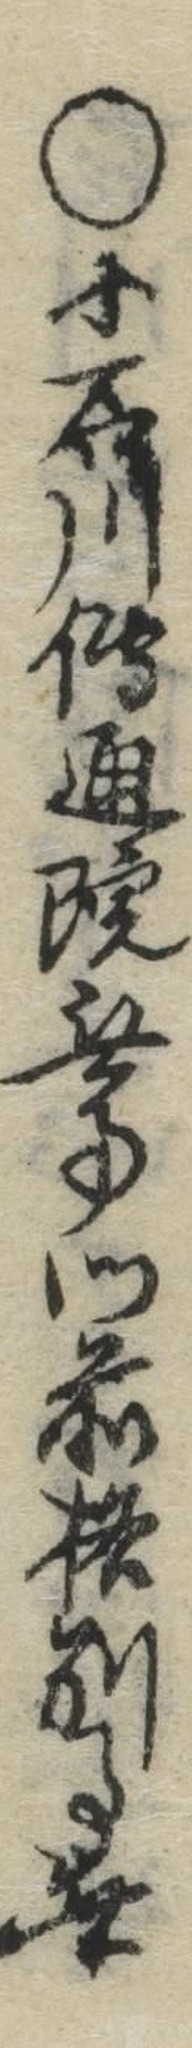〇小石川傳通院無事門前格別事無
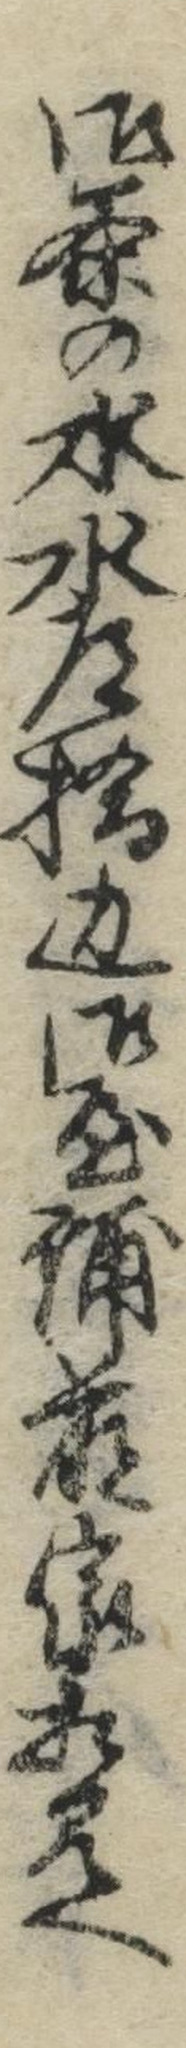御茶の水水道橋辺御屋舗崩家相見へ
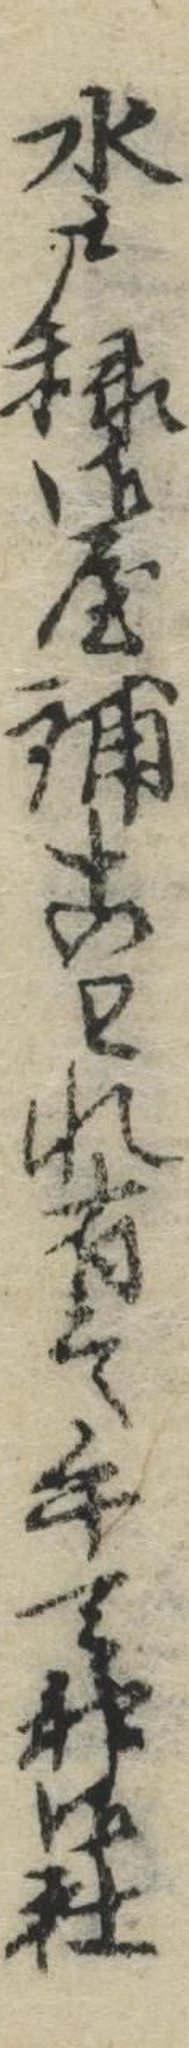水戸様御屋舗こわれ有之牛天神御社
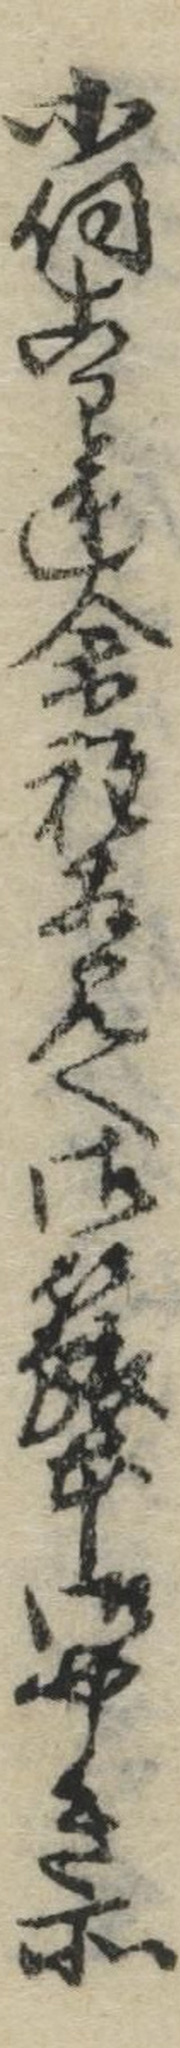等祠こわれ余程相見へ御籏本御やしき所
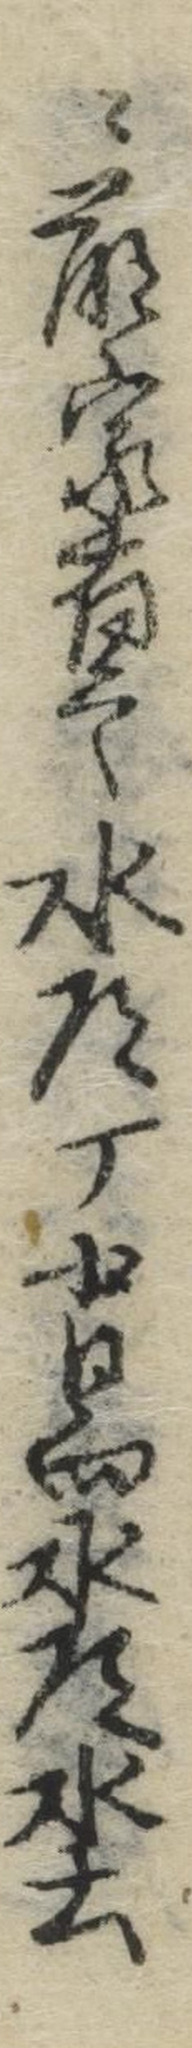〻崩家有之水道丁小日向水道水土
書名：安政三年辰八月廿五日夜　大江都御屋敷方寺社市中共　大嵐水入場所明細書之寫　并街道筋近郷聞書
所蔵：東京大学地震研究所図書室 Earthquake Research Institute Library, The University of Tokyo, JAPAN
